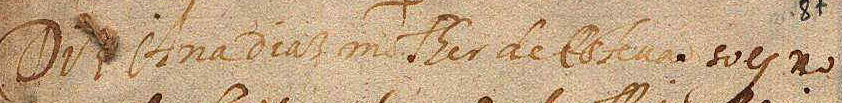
Diz Ana diaz molher de Esteuao soejro
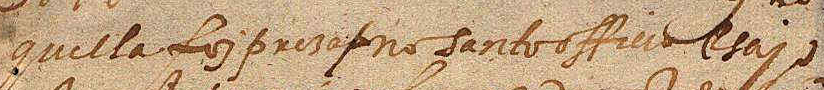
que ela foj presa/ no santo officio E sajo
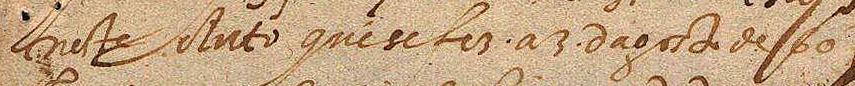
neste Auto que se fez. a 3. dagosto de 60
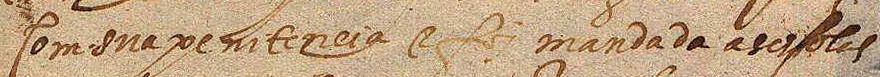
Com sua penitencia E foi mandada as esColas
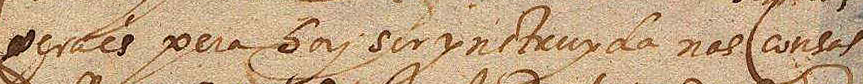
geraes pera haj ser ynstruyda nas cousas
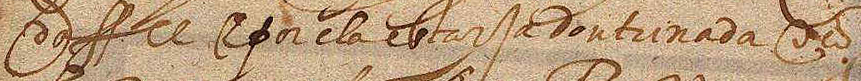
da ffee E por ela estar Ja doutrinada e cō
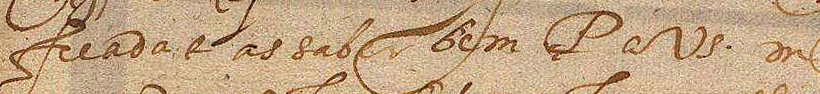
feçada e as saber bem P a V s. me
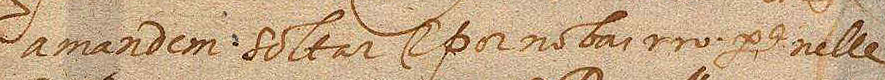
a mandem soltar E por no bairro. ꝑa nelle
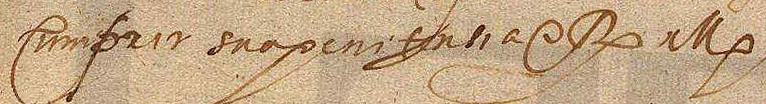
Cumprir sua penitensia e Rꝭ Mꝭ
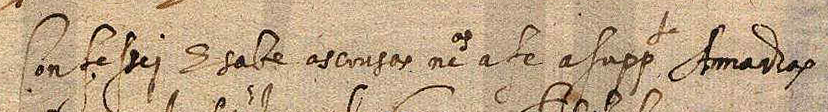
Confessej E sabe as cousas neas a fe a suppte Anna dias
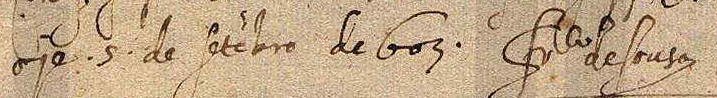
oje .5. de setēbro de 603. frco de sousa
